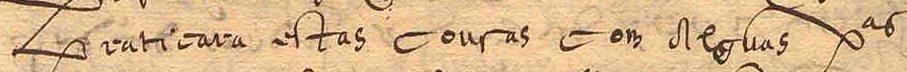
praticaua estas cousas com algūas pas
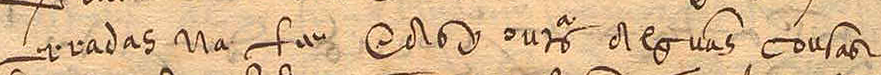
erradas na fee e Asy outas Alguās cousas
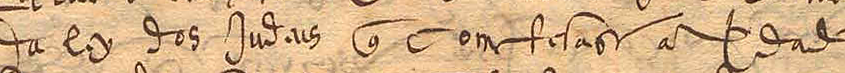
da ley dos Judeus q̄ comfesase a ꝟdade
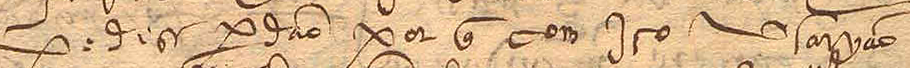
pedise ꝑdão porq̄ com Jso vsaryão
